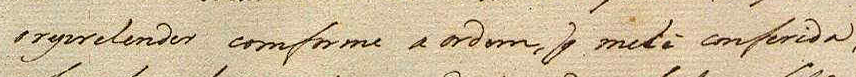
o reprehender comforme a ordem, q̄ me hé conferida,
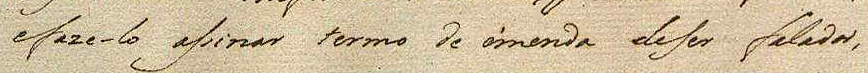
e fazelo assinar termo de emenda de ser falador,
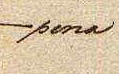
pena
